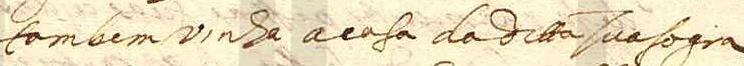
tambem vinha a casa da ditta sua sogra
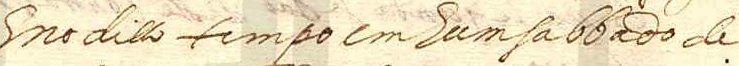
E no ditto tempo em hum sabbado de
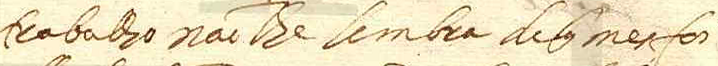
trabalho naõ lhe lembra de q̄ mes foi
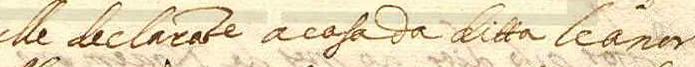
elle declarãte a casa da ditta Leanor
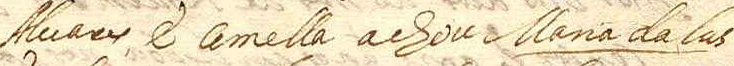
Aluares, & com ella achou Maria da Lus
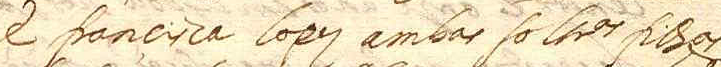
& françisca Lopez ambas soltras filhas
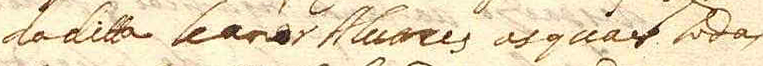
da ditta Leanor Aluares as quaes todas
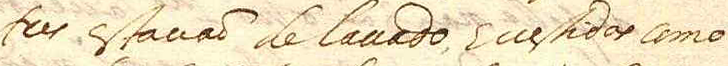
tres estauaõ de lauado, E uestidas como
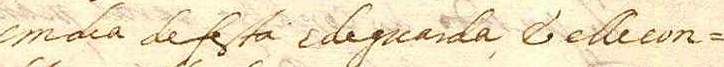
em dia de festa E de guarda, & elle con
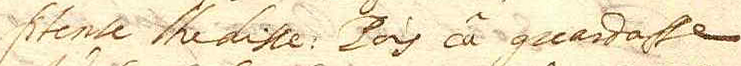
fitente lhe disse: Pois câ guardasse
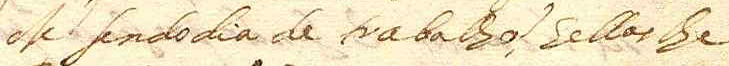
oIe? Sendo dia de trabalho? E ellas lhe
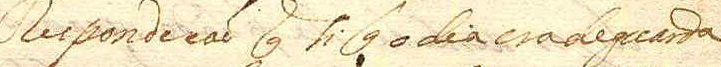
Responderaõ q̄ si q̄ o dia era de guarda
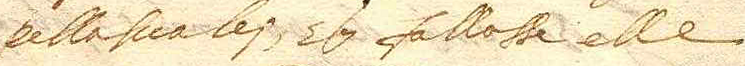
pella sua lej, E q̄ fallasse elle
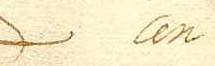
con
